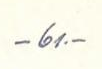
61
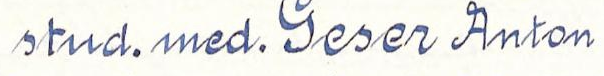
stud. med. Geser Anton
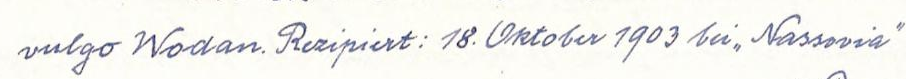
vulgo Wodan. Rezipiert: 18. Oktober 1903 bei „Nassowia“
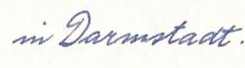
in Darmstadt
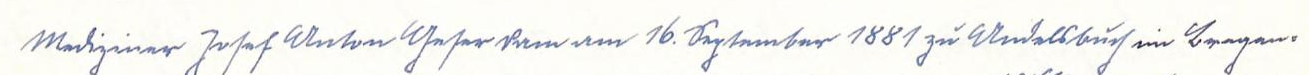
Mediziner Joseph Anton Geser kam am 16. September 1881 zu Andelsbuch im Bregen-
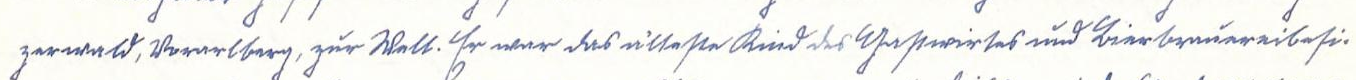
zerwald, Vorarlberg, zur Welt. Er war das älteste Kind des Gastwirtes und Bierbrauereibesi-
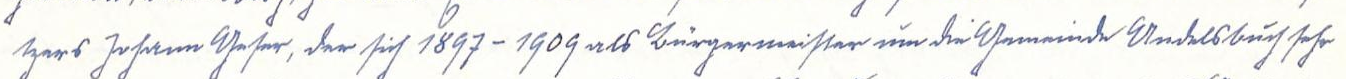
tzers Johann Geser, der sich 1897-1909 als Bürgermeister der Gemeinde Andelsbuch sehr
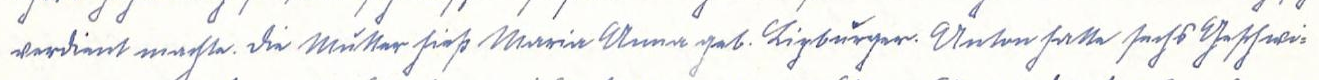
verdient gemacht. Die Mutter hieß Maria Anna geborene Ligburger. Anton hatte sechs Geschwi-
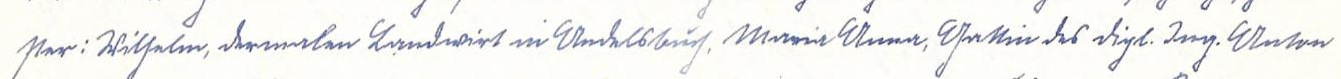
ster: Wilhelm, dermalen Landwirt in Andelsbuch, Maria Anna, Gattin des Dipl. Ing. Anton
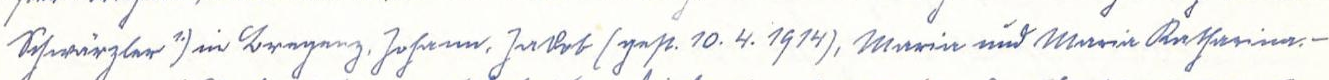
Schwärzler 1) in Bregenz, Johann, Jakob (gest. 10.4.1914), Maria und Maria Katharina.-
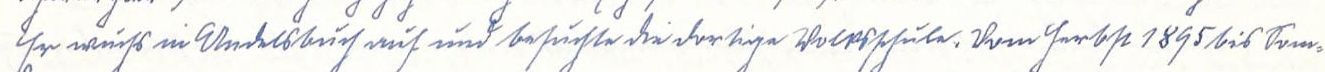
Er wuchs in Andelsbuch auf und besuchte die dortige Volksschule, vom Herbst 1895 bis Som-
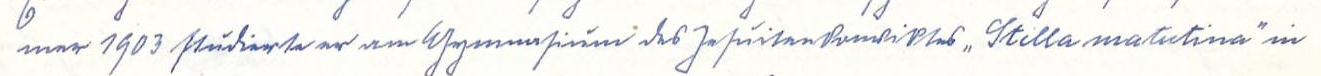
mer 1903 studierte er am Gymnasium des Jesuitenkonviktes „Stella Matutina“ in
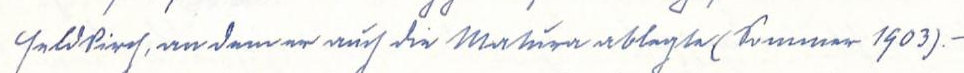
Feldkirch, an denen er auch die Matura ablegte (Sommer 1903).-
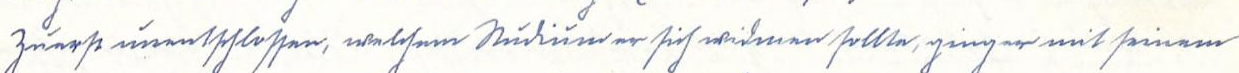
Zunächst unentschlossen, welchem Studium er sich widmen sollte, ging er mit seinem
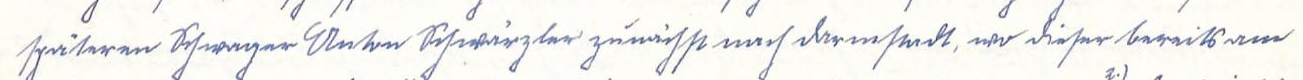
späteren Schwager Anton Schwärzler zunächst nach Darmstadt, wo dieser bereits am
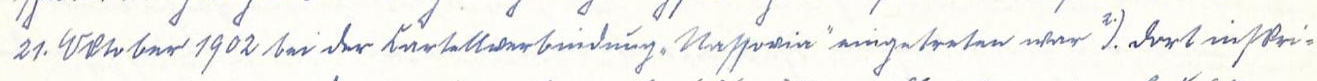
21. Oktober 1902 bei der Cartellverbindung Nassowia eingetreten war. 2) Dort inskri-
